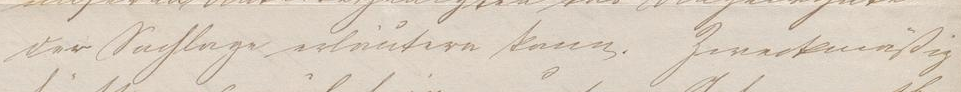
der Sachlage erläutern kann. Zweckmäßig
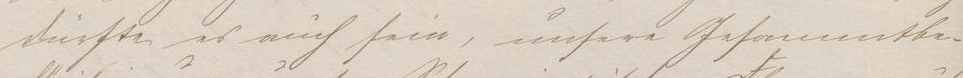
dürfte es auch sein, unsere Gesammtbe-
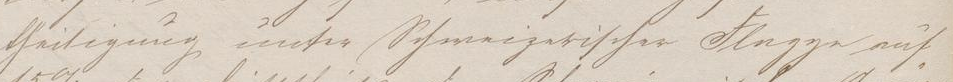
theiligung unter Schweizerischer Flage auf
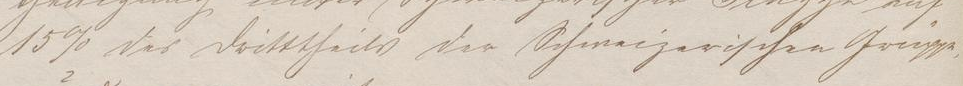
15% des Dritttheils der Schweizerischen Gruppe,
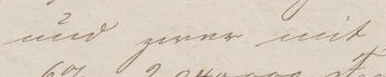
und zwar mit
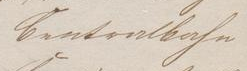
Centralbahn
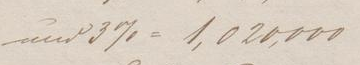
und 3% = 1,020,000 "
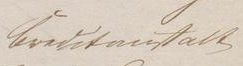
Creditanstalt
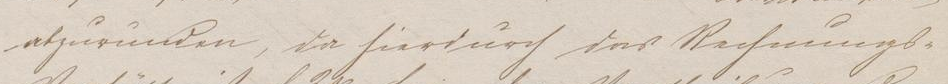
abzurunden, da hierdurch das Rechnungs-
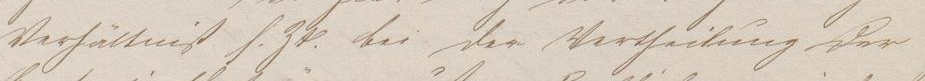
Verhältniß s. Zt. bei der Vertheilung der
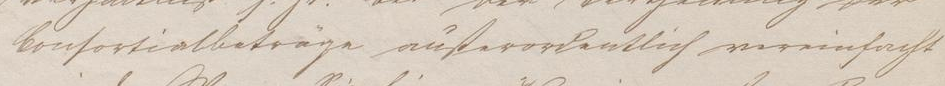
Consortialbeträge außerordentlich vereinfacht
